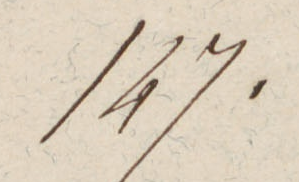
147.
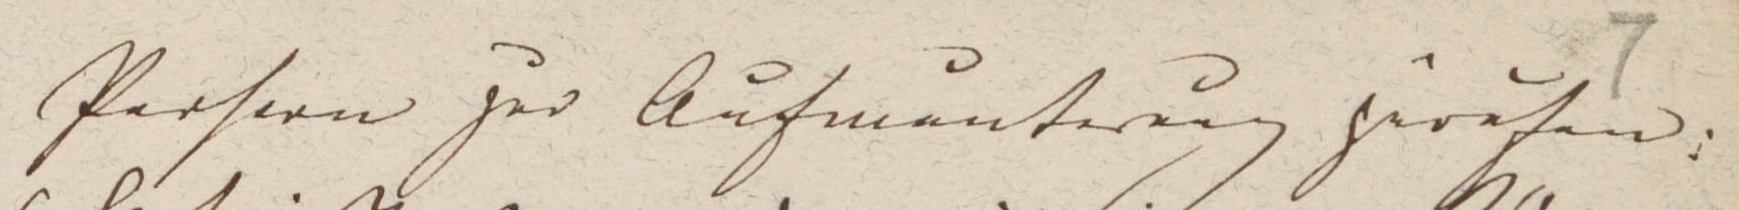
Persern zur Aufmunterung zurufen:
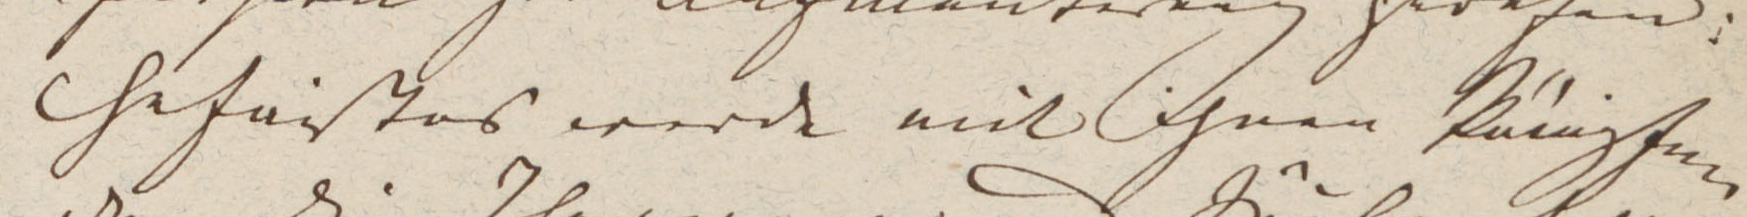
Hefaistos werde mit ihnen kämpfen
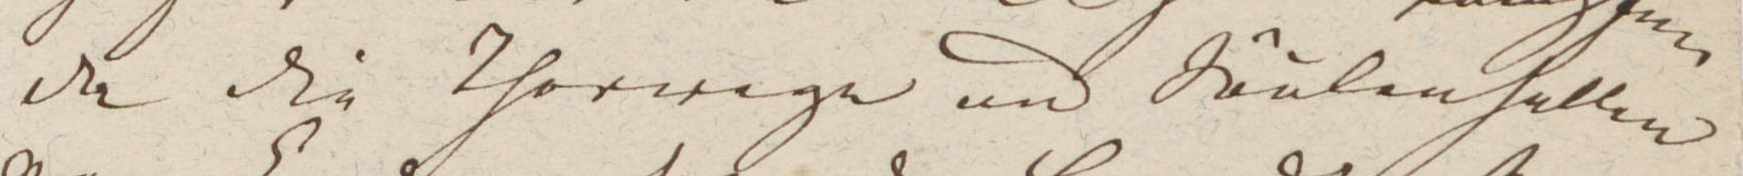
da die Thorwege und Säulenhallen
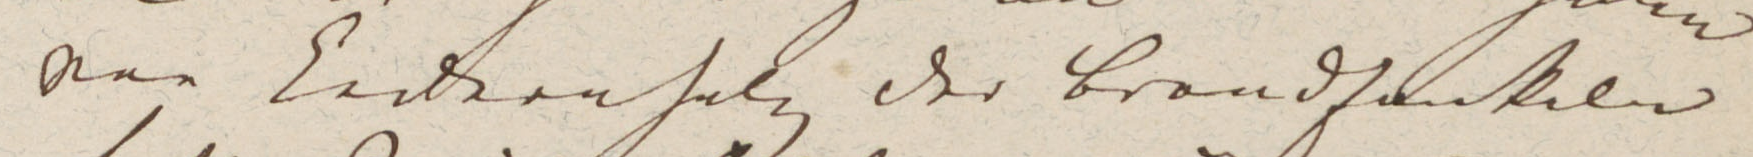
von Cedernholz der Brandfackeln
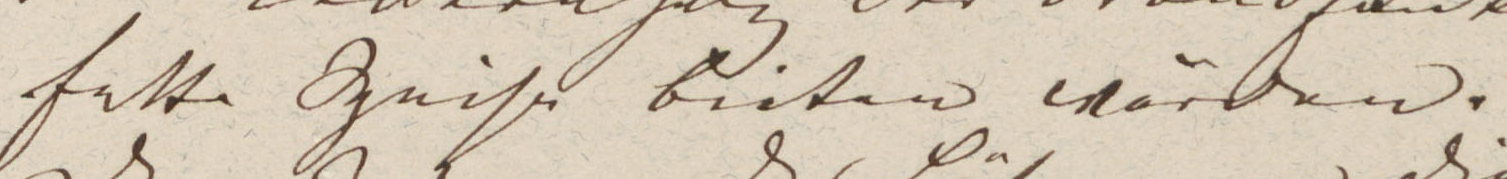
fette Speise bieten würden.
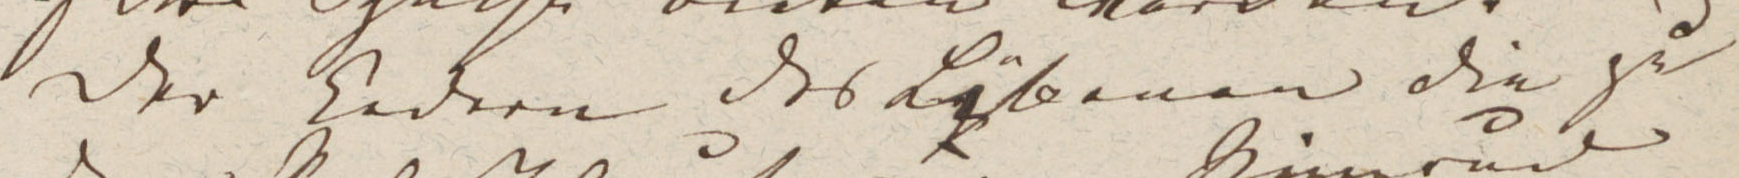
Der Cedern des Lyibanon die zu
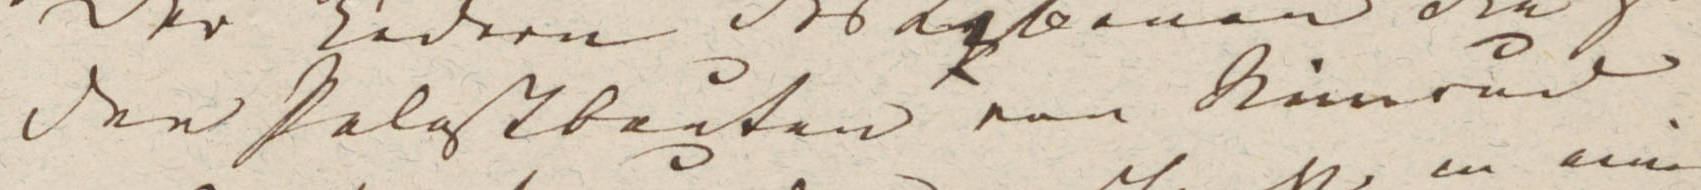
den Palastbauten von Nimrud
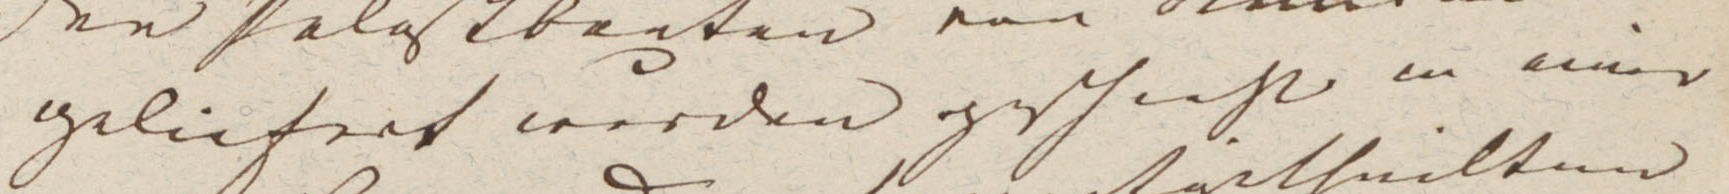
geliefert wurden geschieht in einer
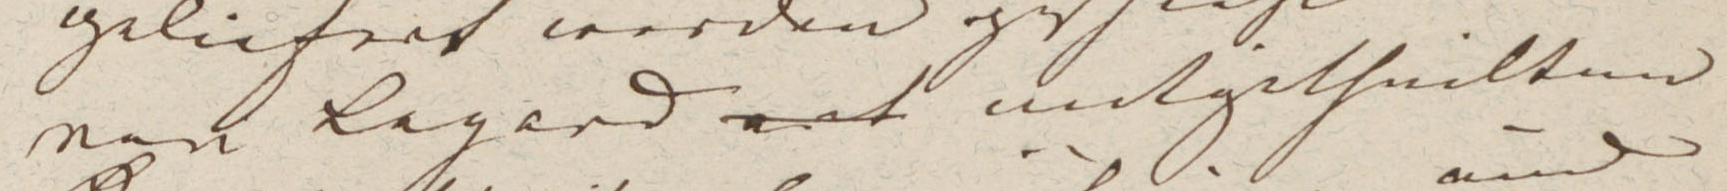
von Layard it mitgetheilten
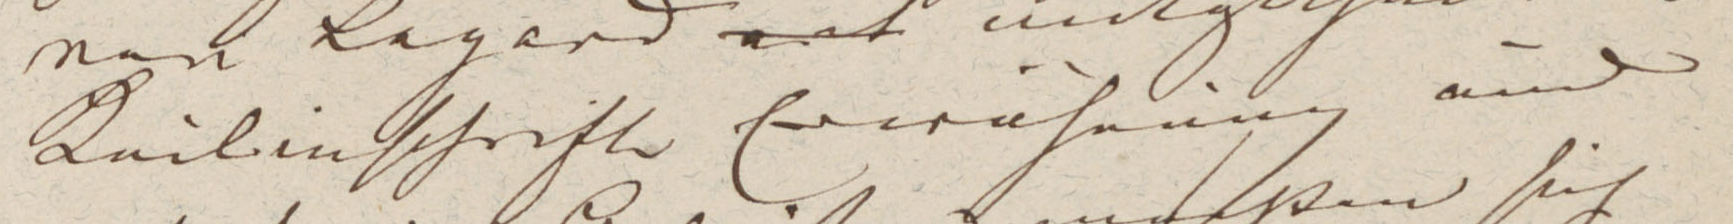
Keilinschrift Erwähnung und
